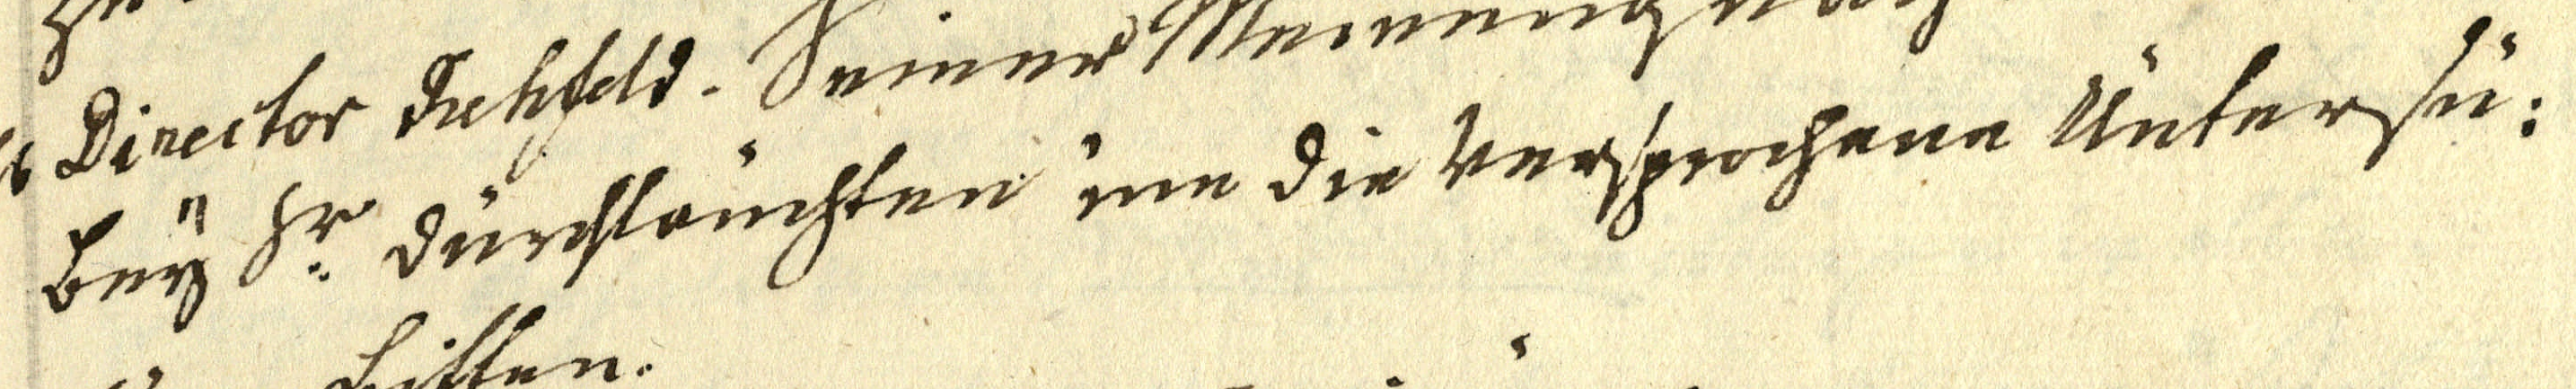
beÿ Sr Durchlauchten um die versprochene Untersu¬
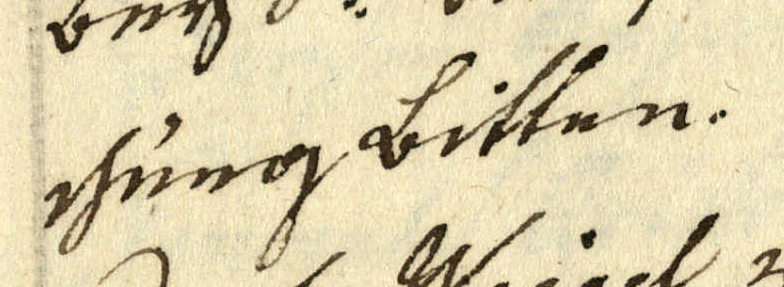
chung bitten.
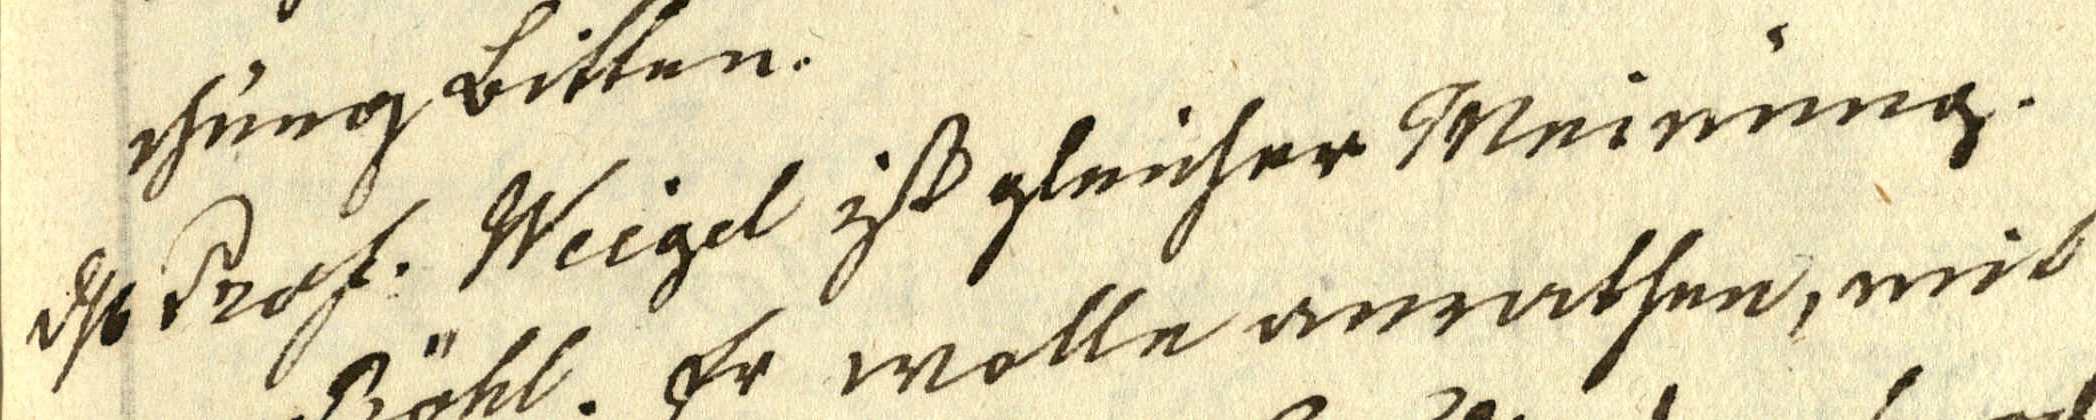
dh Prof. Weigel ist gleicher Meinung.
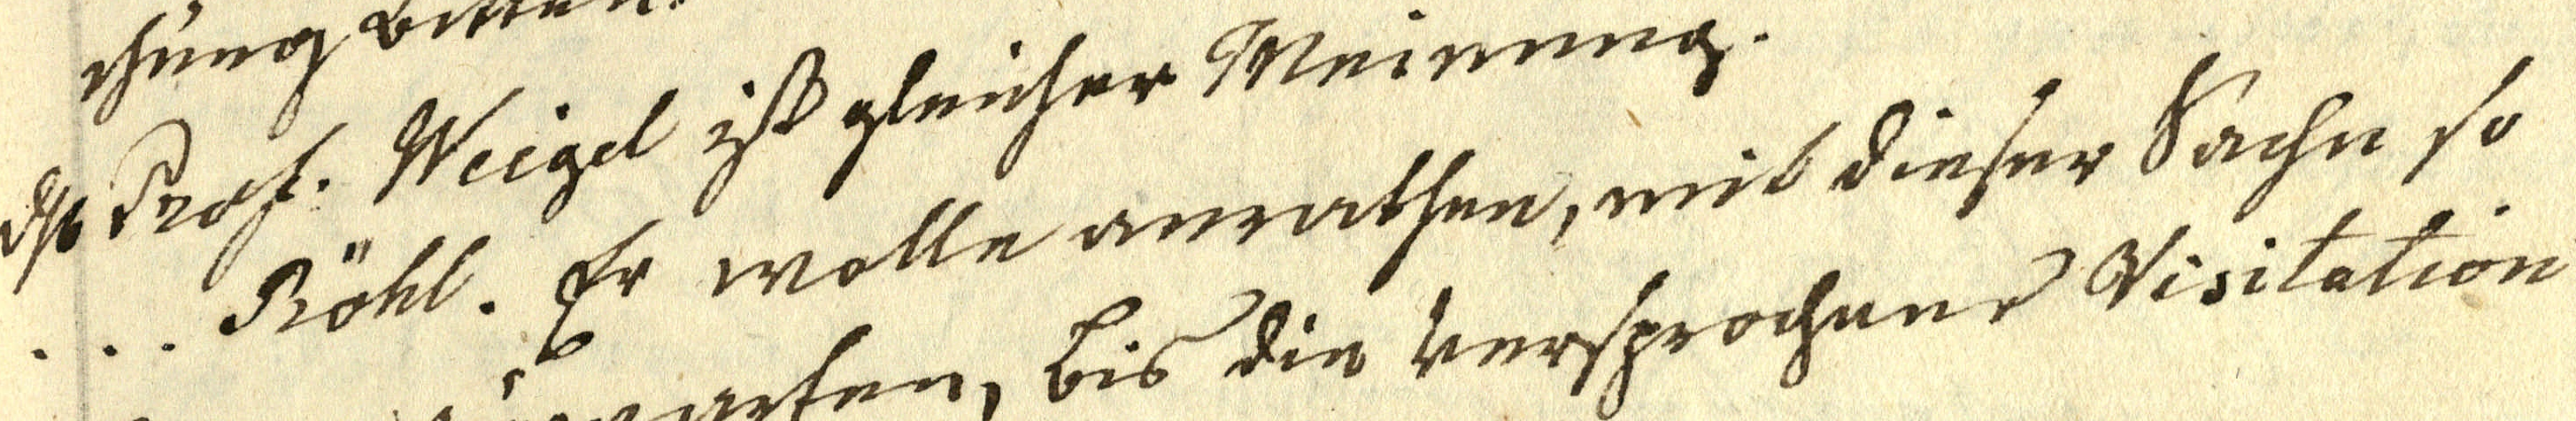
Röhl. Er wolle anrathen, mit dieser Sache so
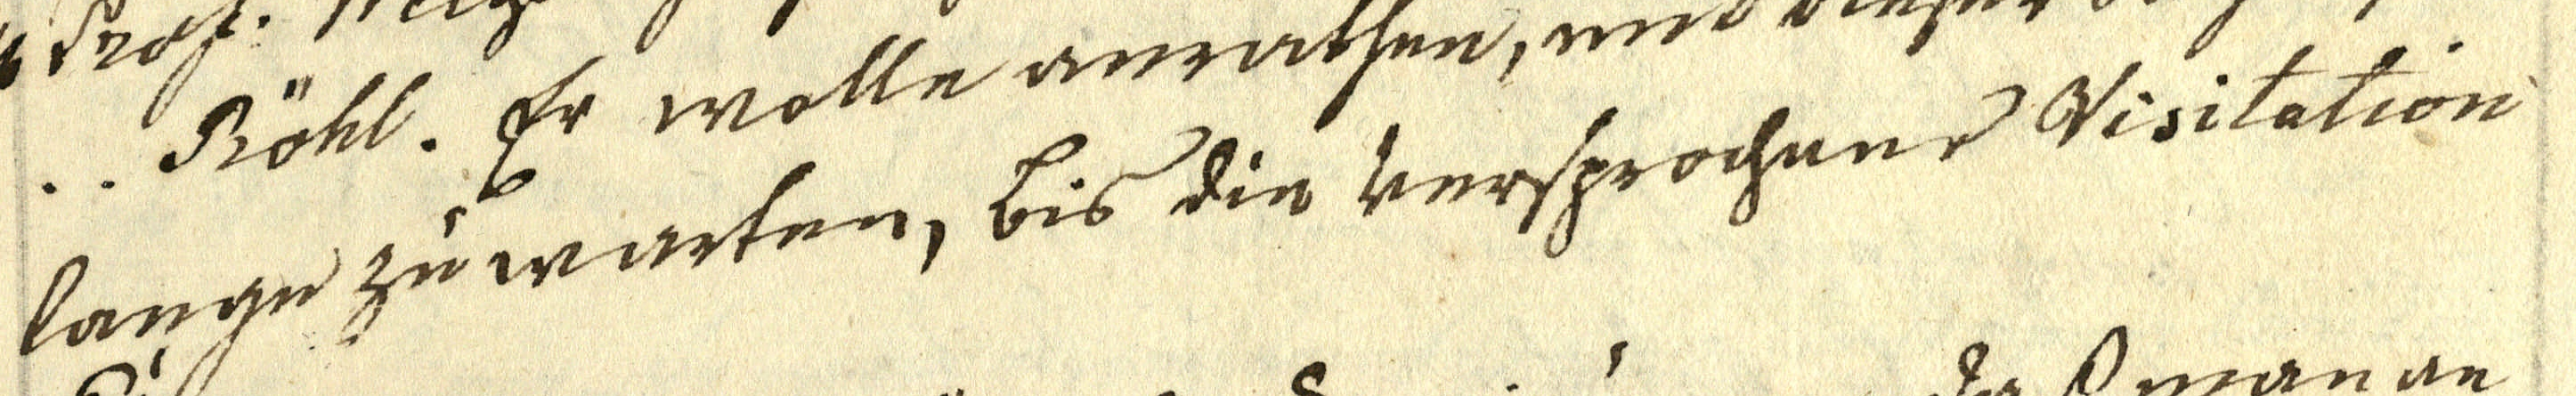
lange zu warten, bis die versprochene Visitation
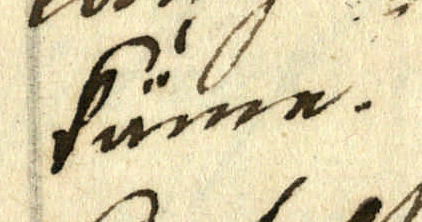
käme.
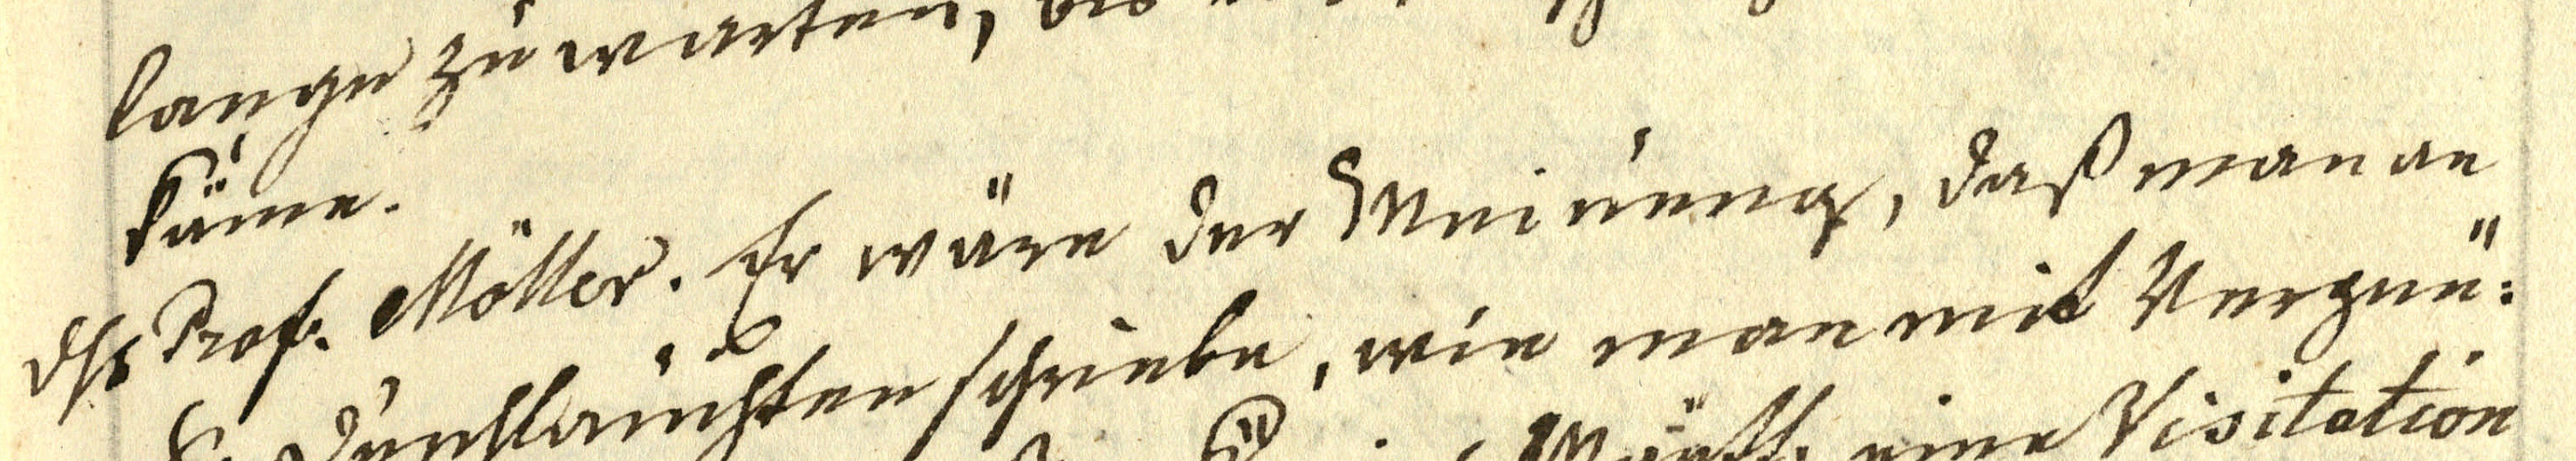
dh. Prof Möller. Er wäre der Meinung, daß man an
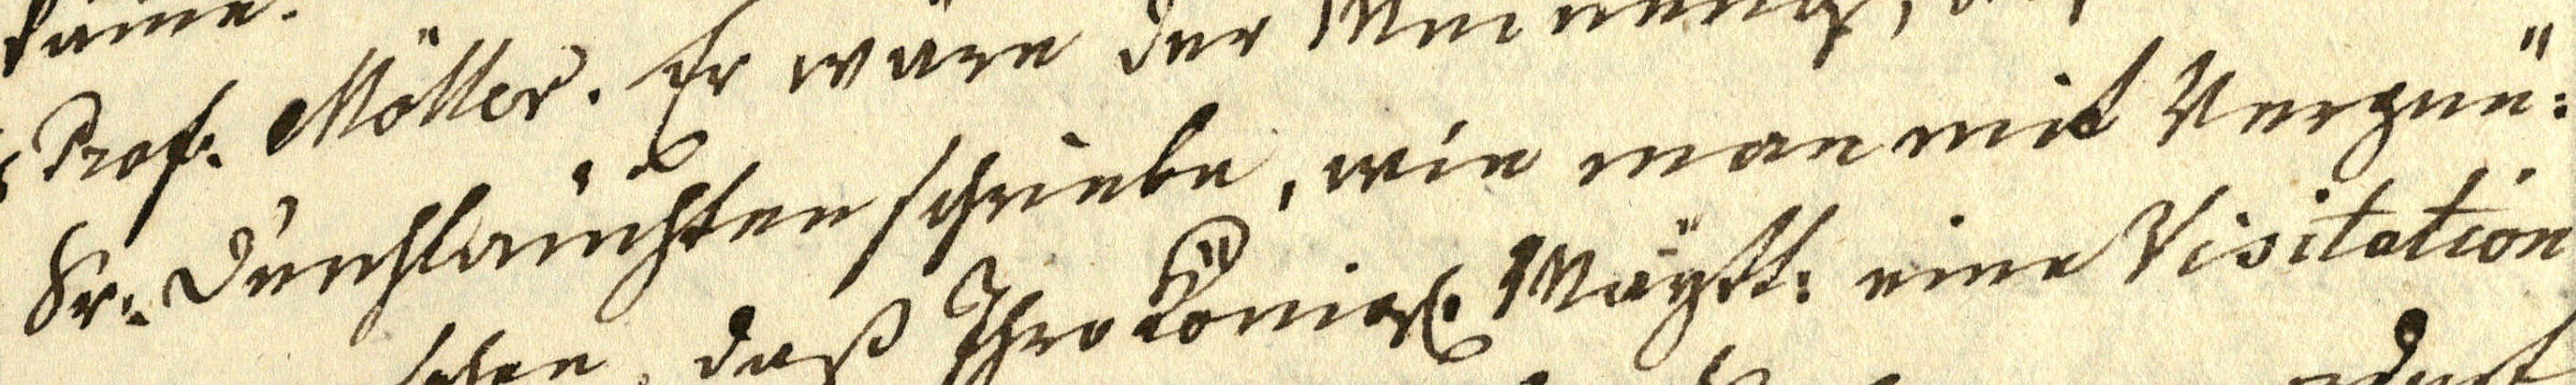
Sr Durchlauchten schriebe, wie man mit Vergnü¬
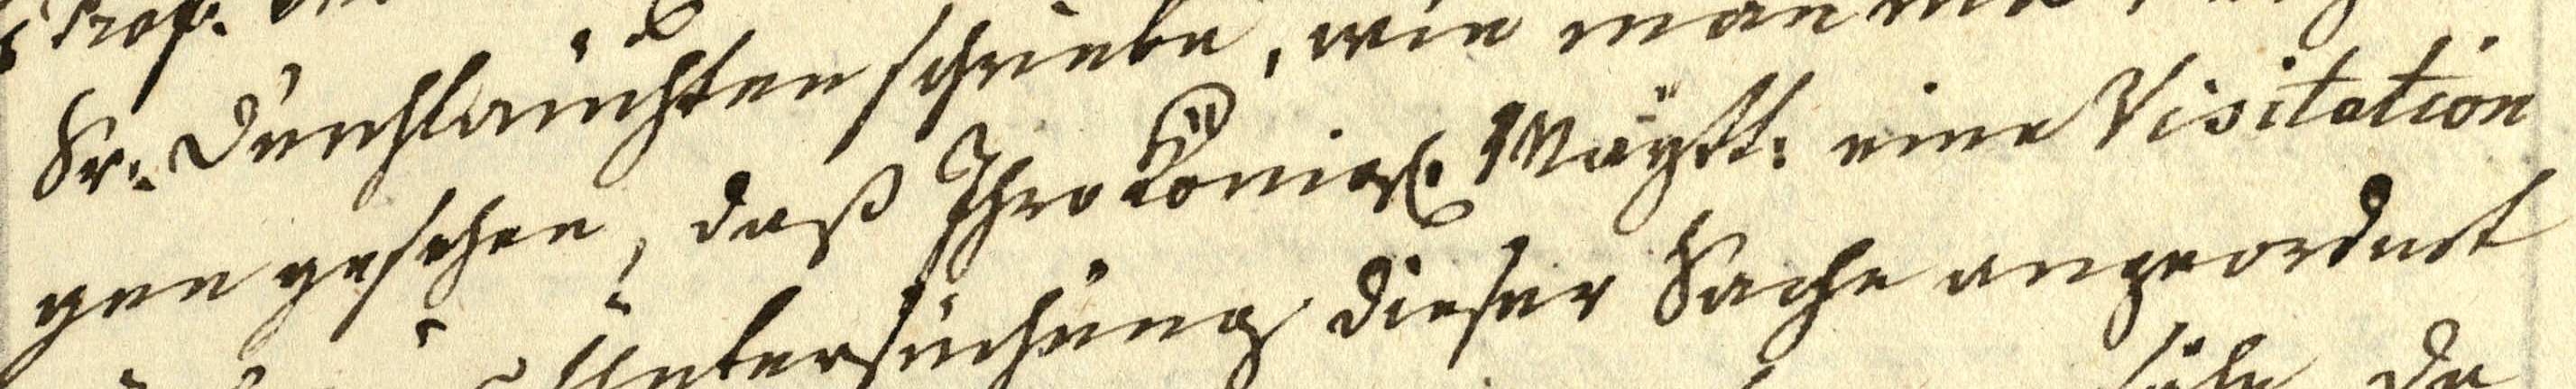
gen gesehen, daß Ihro Königl. Maÿtt. eine Visitation
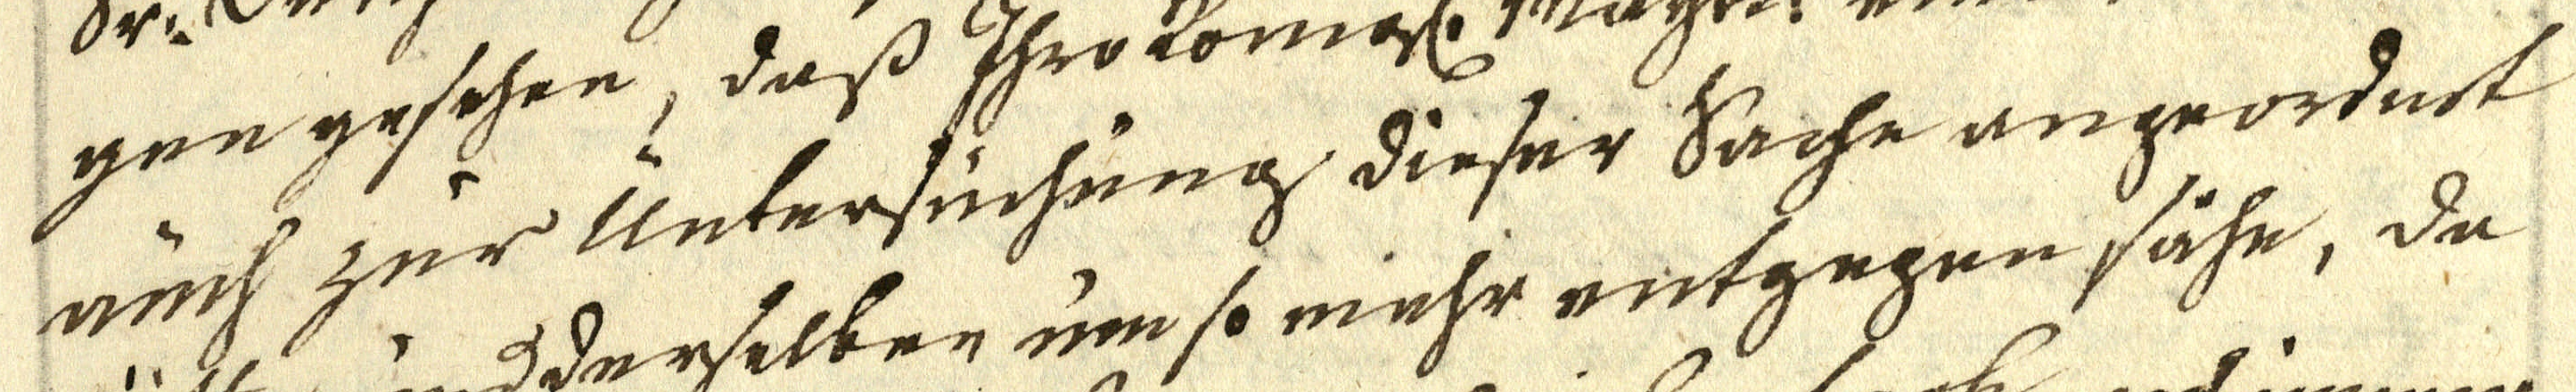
auch zur Untersuchung dieser Sache angeordnet
